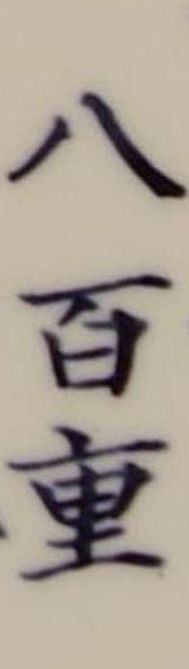八百重
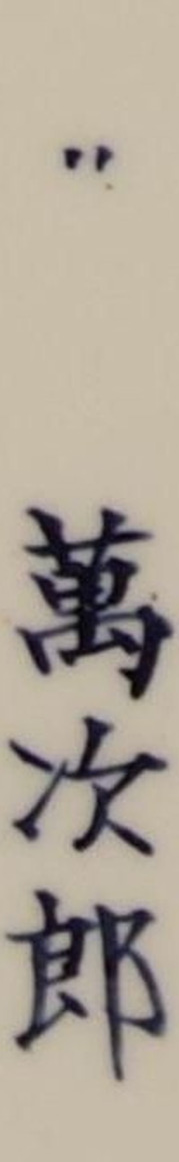萬次郎
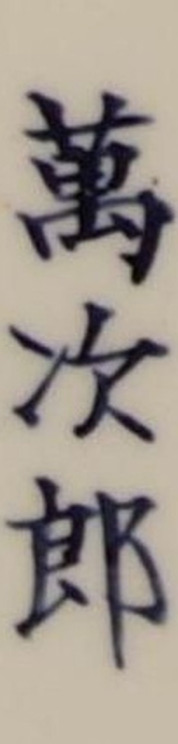萬次郎
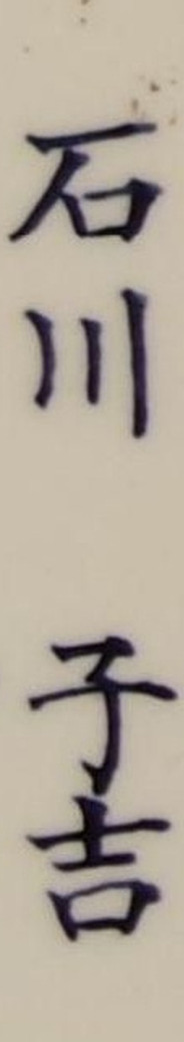石川子吉
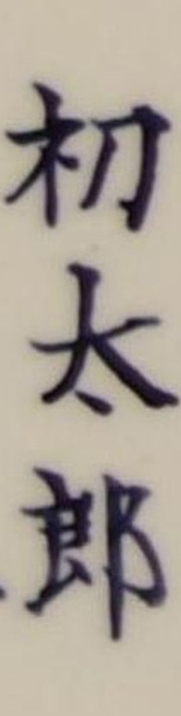初太郎

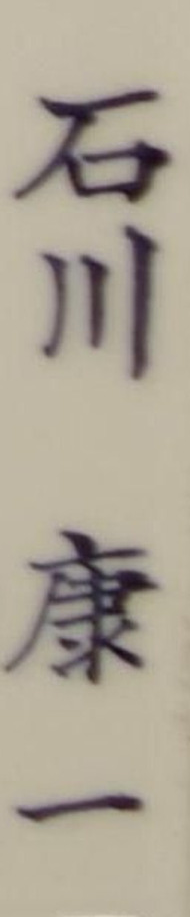石川康一
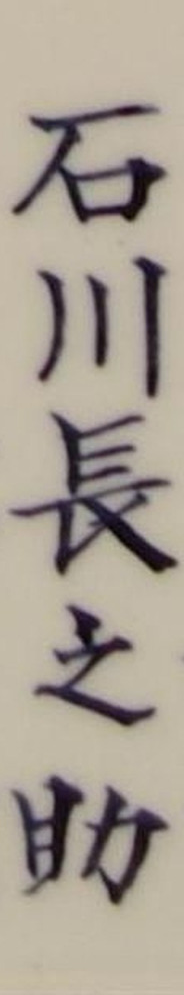石川長之助
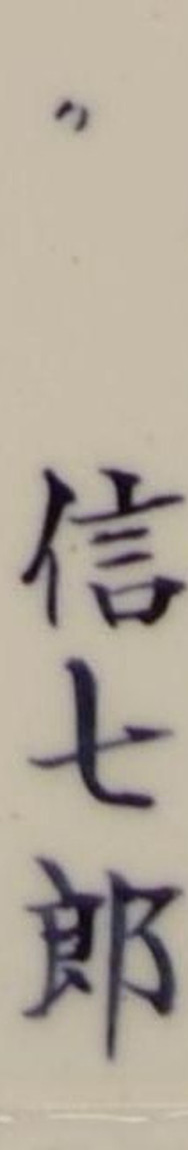信七郎
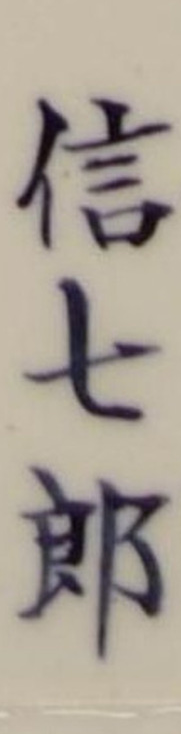信七郎
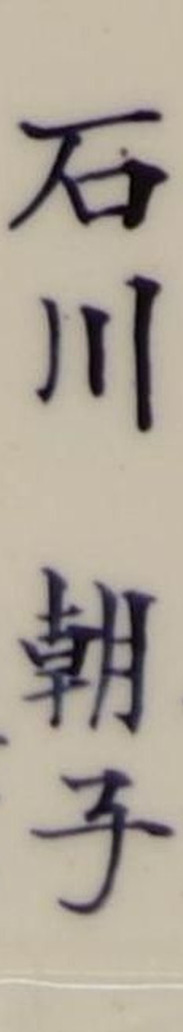石川朝子
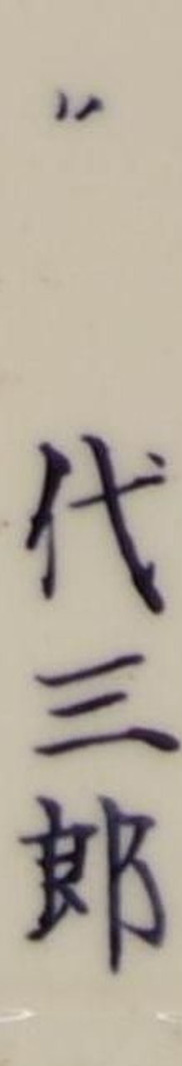代三郎
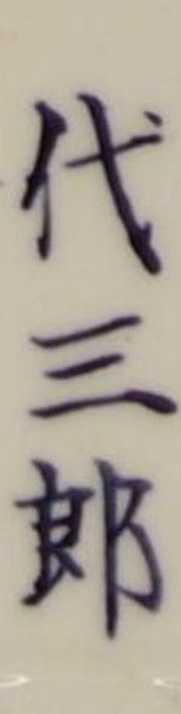代三郎

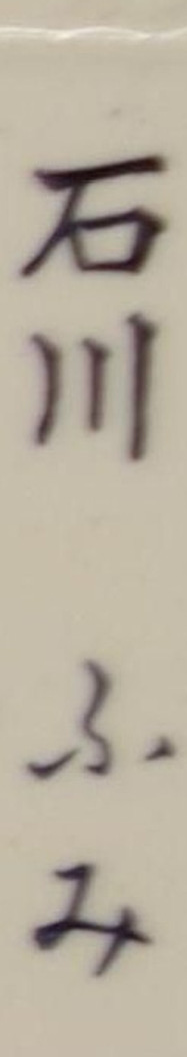石川ふみ
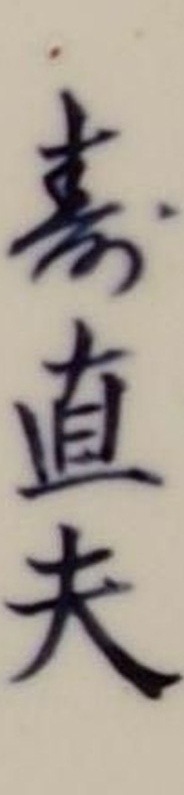寿直夫
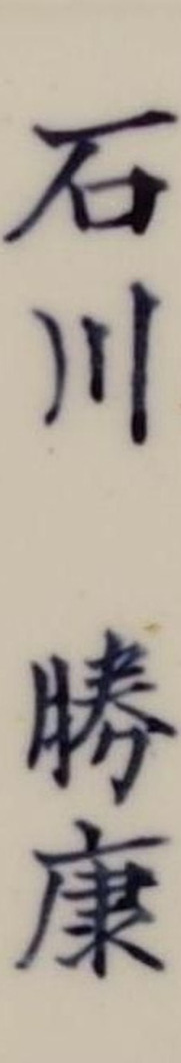石川勝康
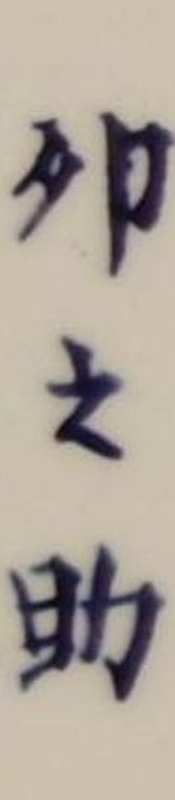卯之助
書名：M~S
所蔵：高野山金剛峯寺
